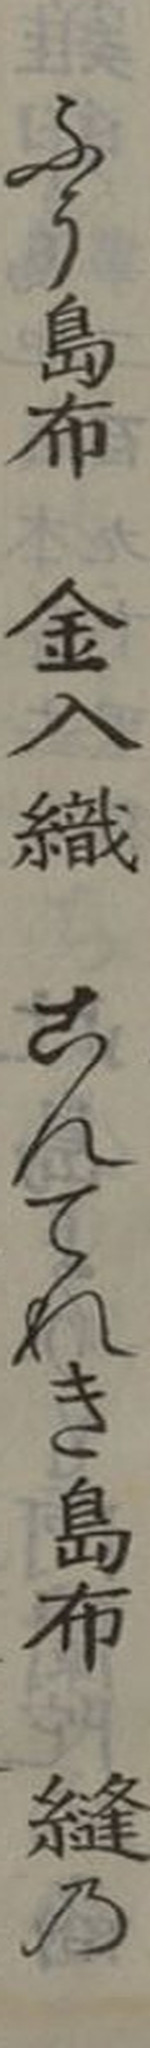ふう島布金入織こんてんき島布縫の
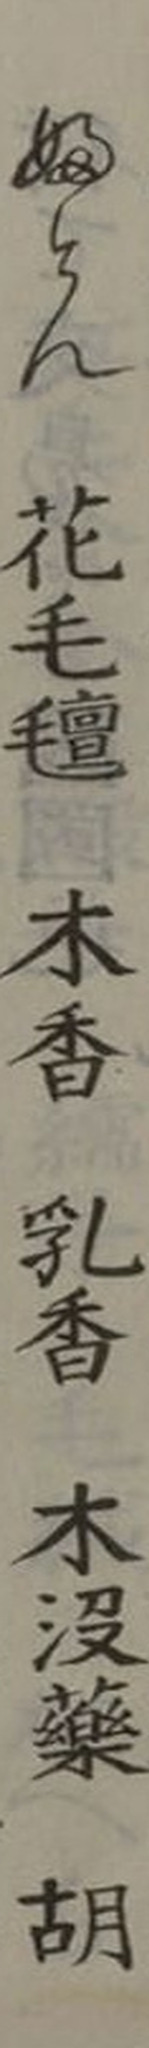ふとん花毛氊木香乳香木没藥胡
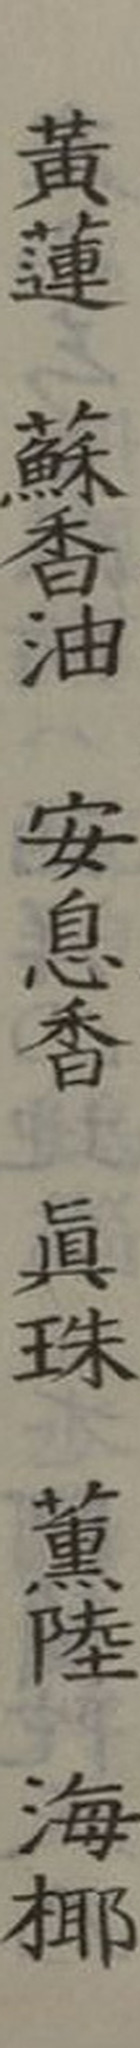黃蓮蘇香油安息香眞珠薫陸海椰
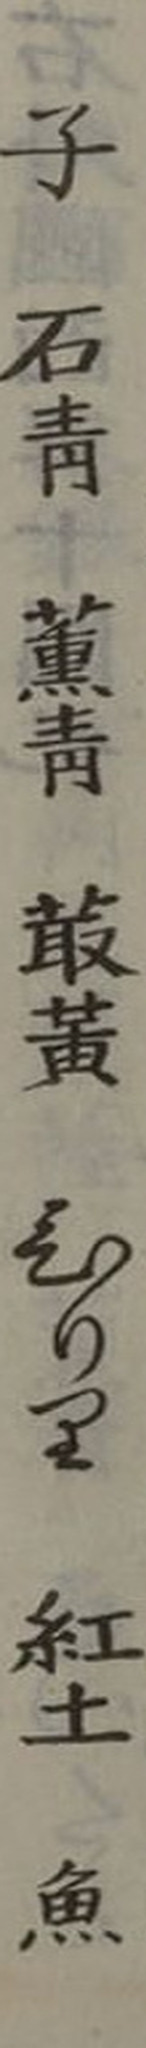子石青薫青黃ひりり紅土魚
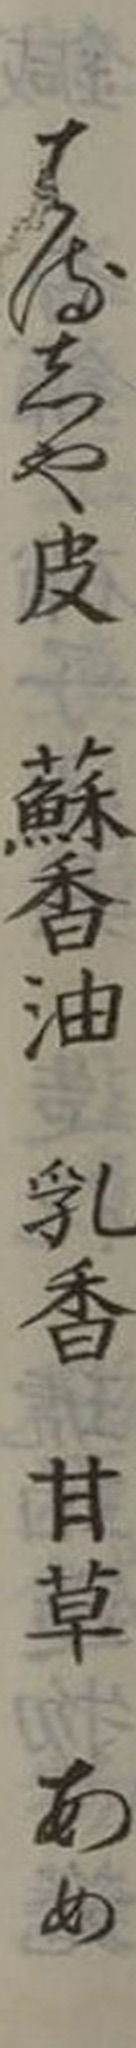はるしや皮蘇香油乳香甘草あめ
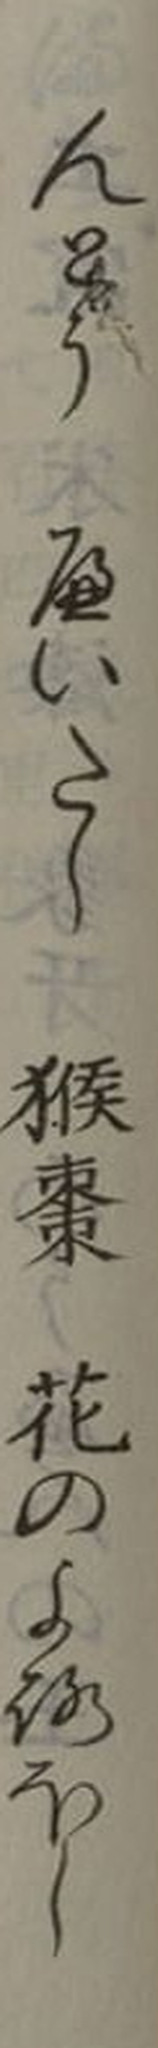んとうへいたし猴棗花のよろほし
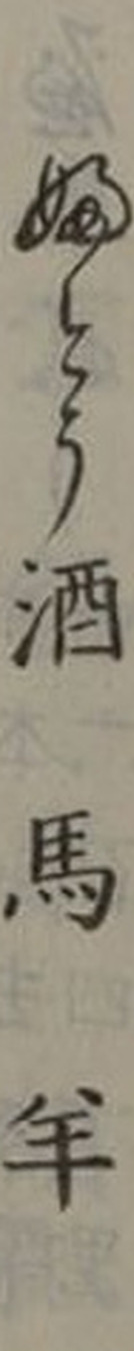ふとう酒馬羊
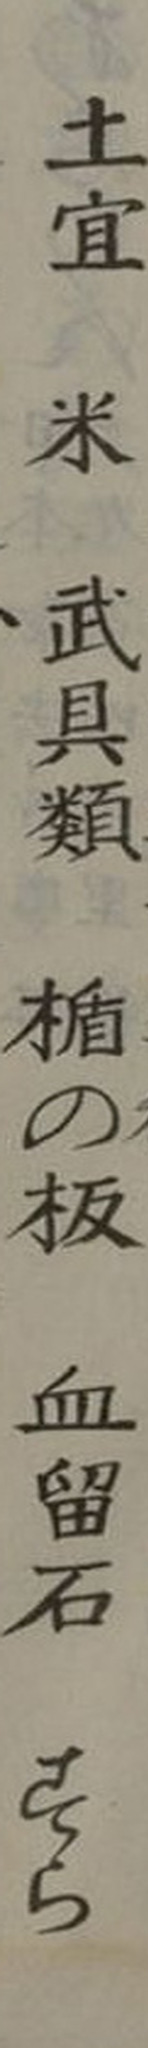土宜米武具類楯の板血留石すら
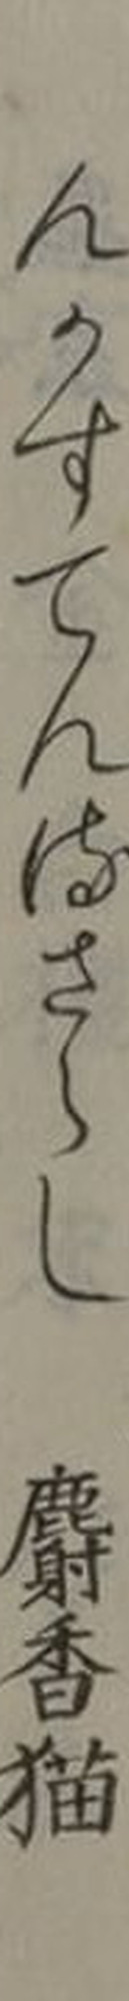んかすてんるさらし麝香猫
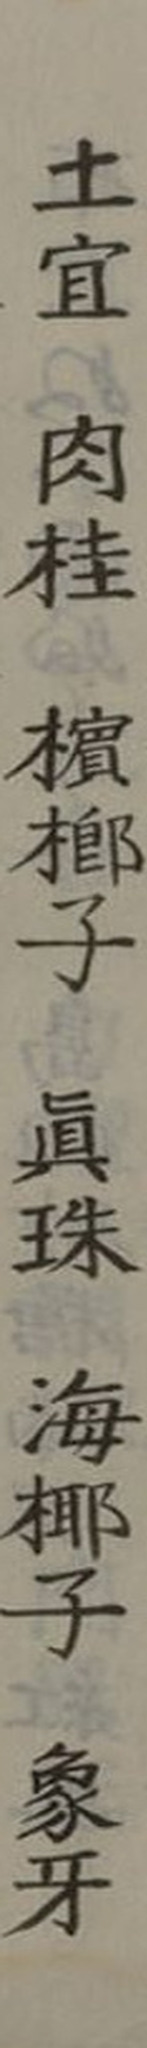土宜肉桂㯽椰子眞珠海椰子象牙
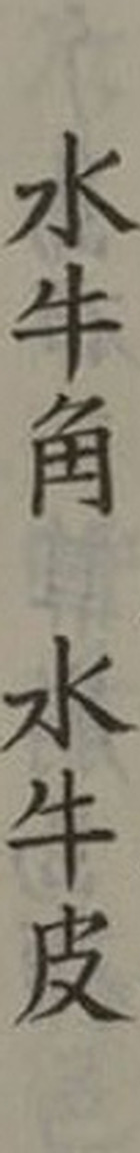水牛角水牛皮
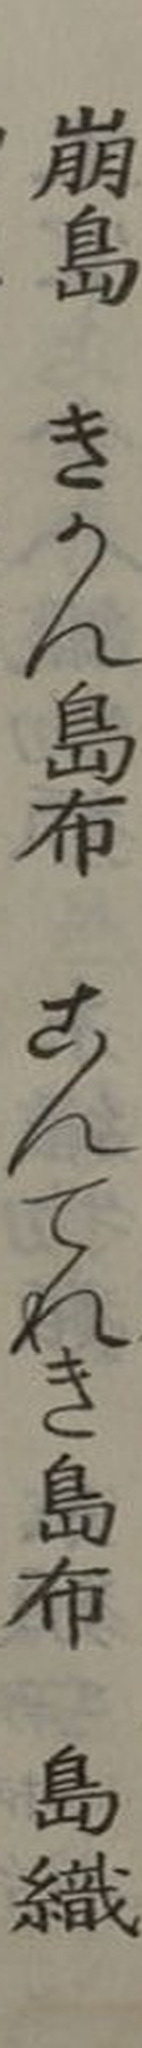崩島きかん島布こんてれき島布島織
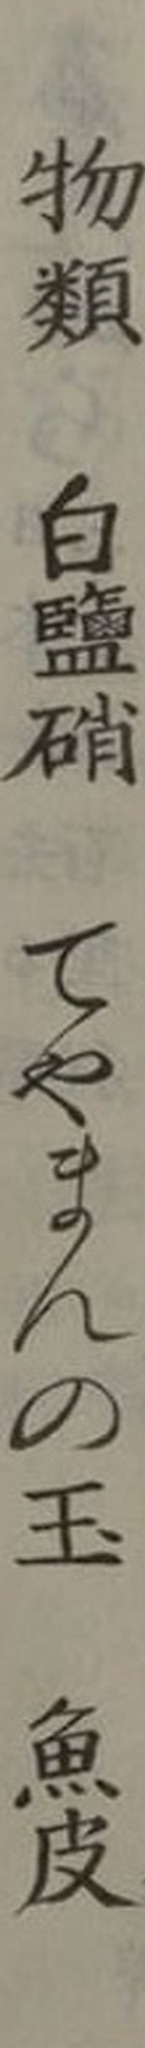物類白鹽硝てやまんの玉魚皮

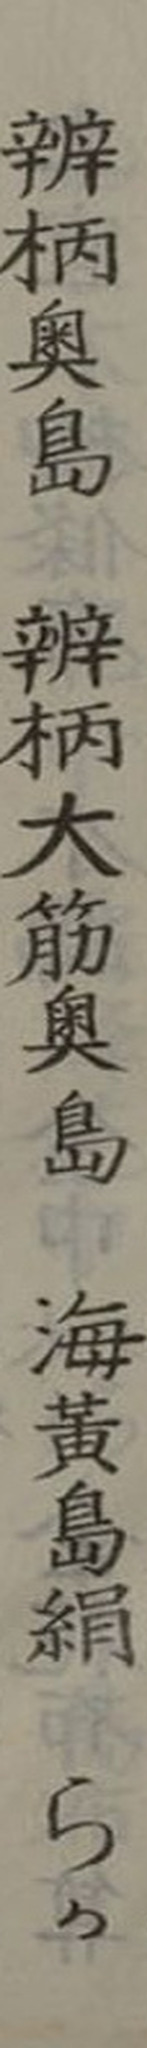辨柄奧島辨柄大筋奧島海黃島絹らか
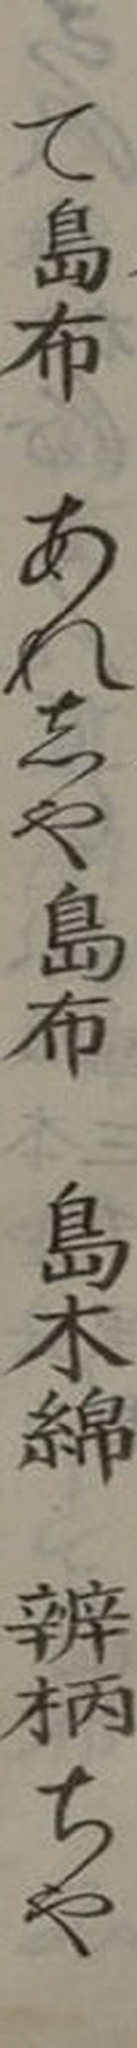て島布あれしや島布島木綿辨柄ちや
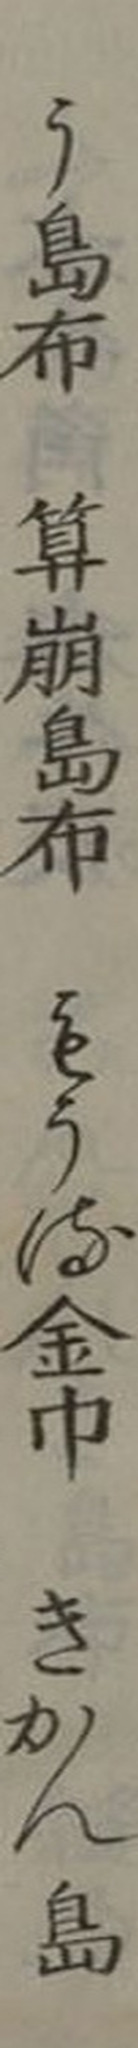う島布算崩島布もうる金巾きかん島
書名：骨董録
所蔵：University of the Ryukyus Library
